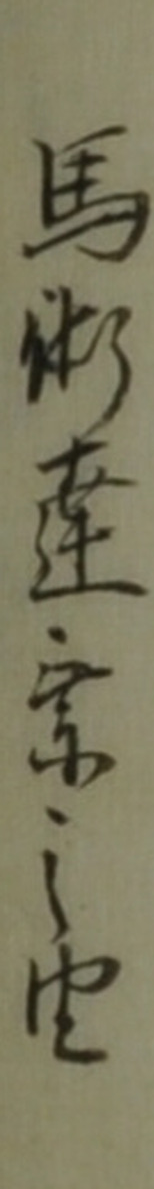馬術達乗之由
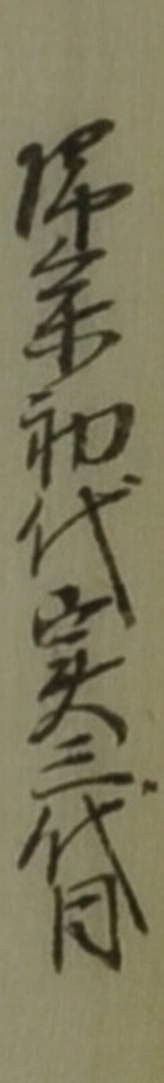帰参初代実三代目
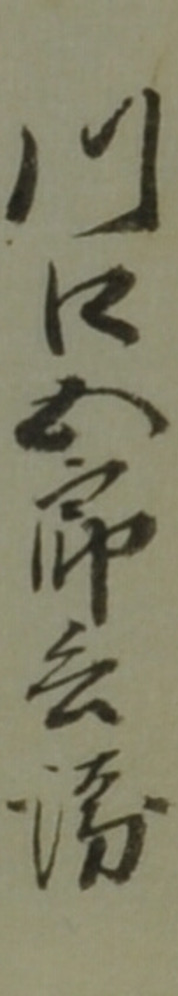川口五郎兵衛
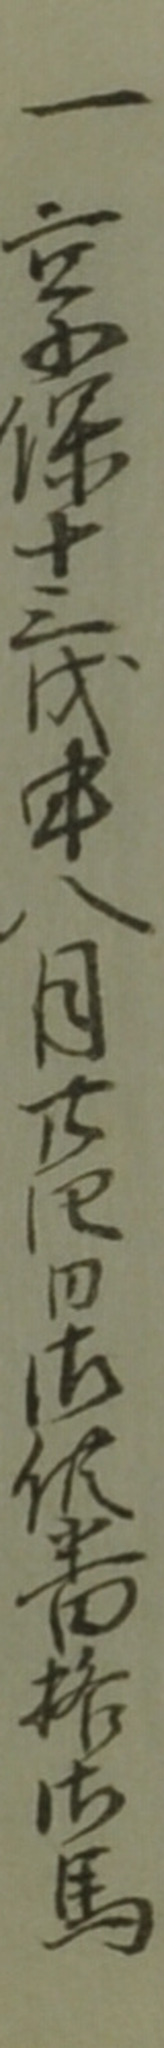一享保十三戊申八月廿四日御供番格御馬
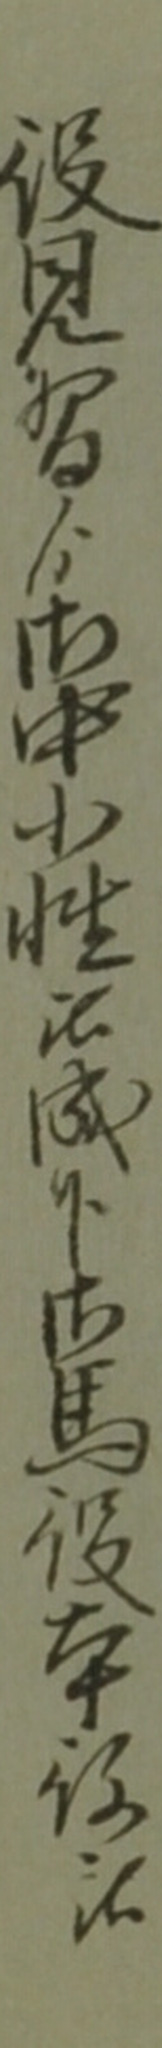役見習より御中小性被成下御馬役本役被
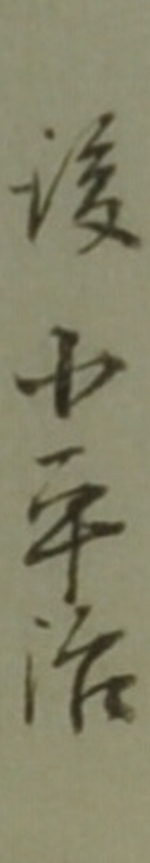後小平治
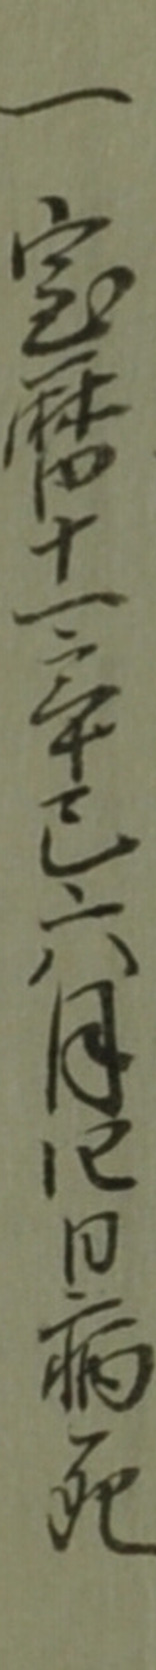一宝暦十一辛巳六月四日病死
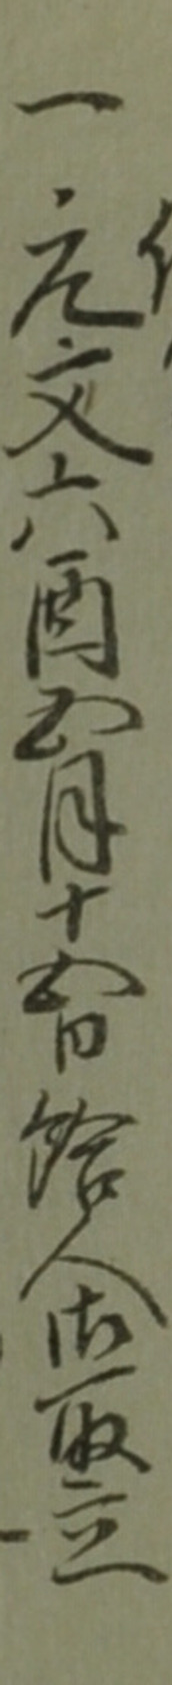一元文六酉五月十五日給人御取立
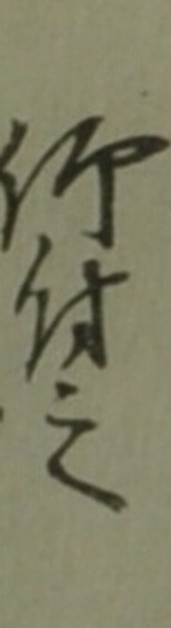仰付之
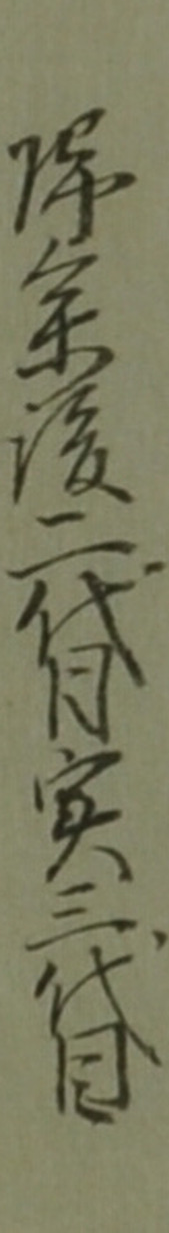帰参後二代目実三代目
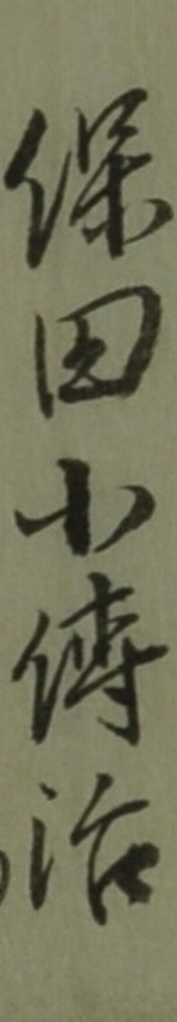保田小傳治
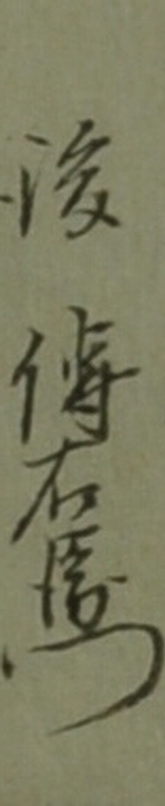後傳右衛門
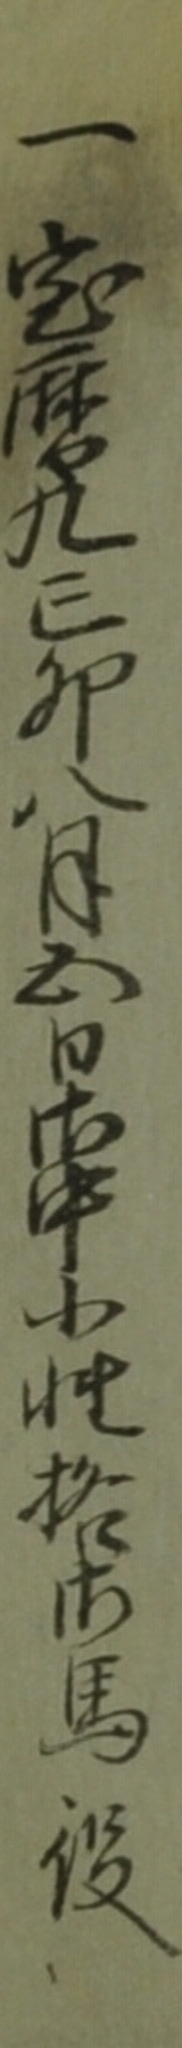一宝暦九己卯八月五日御中小性格御馬役
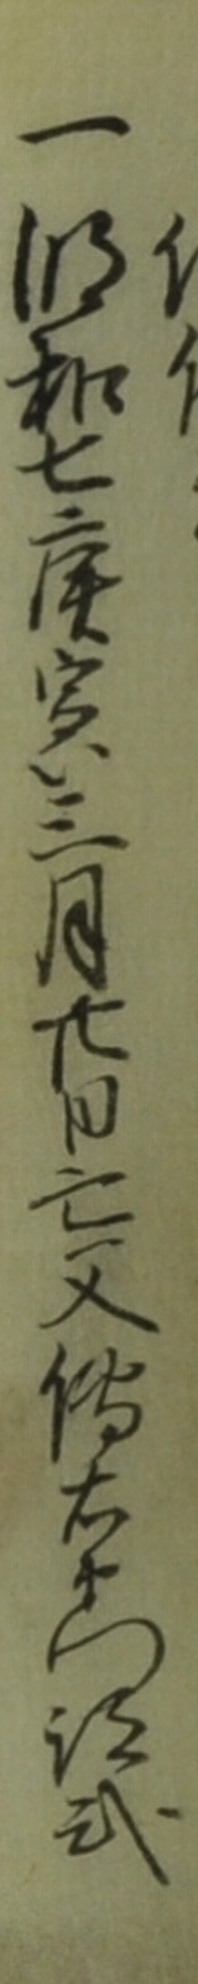一明和七庚寅三月廿日亡父傳右衛門跡式
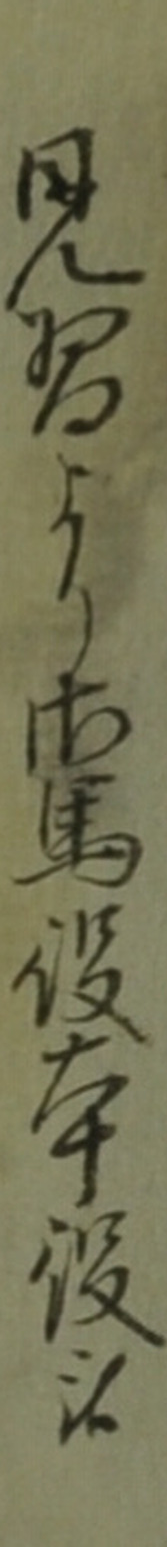見習より御馬役本役被
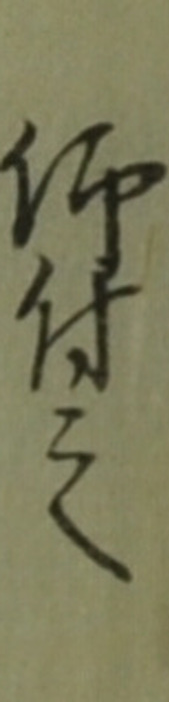仰付之
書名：諸御役代々録（八）
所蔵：伊那市立高遠町図書館・合同会社AMANE
